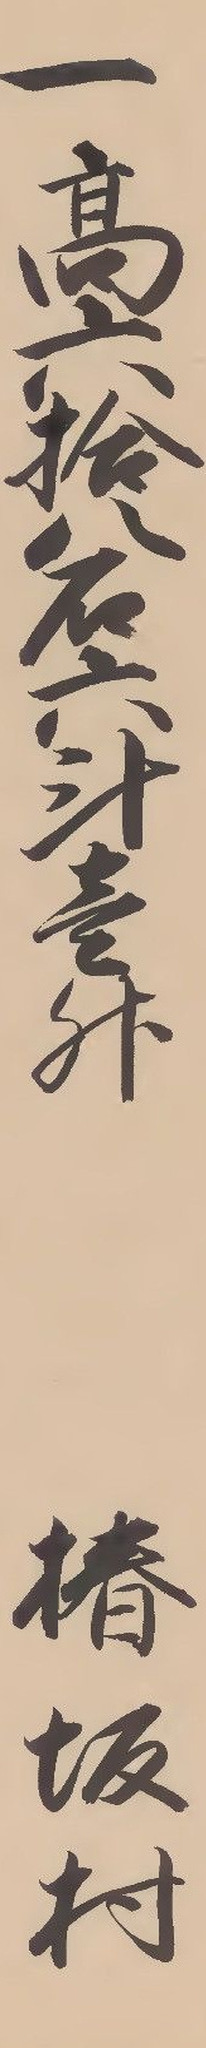一高六拾八石六斗壱升椿坂村
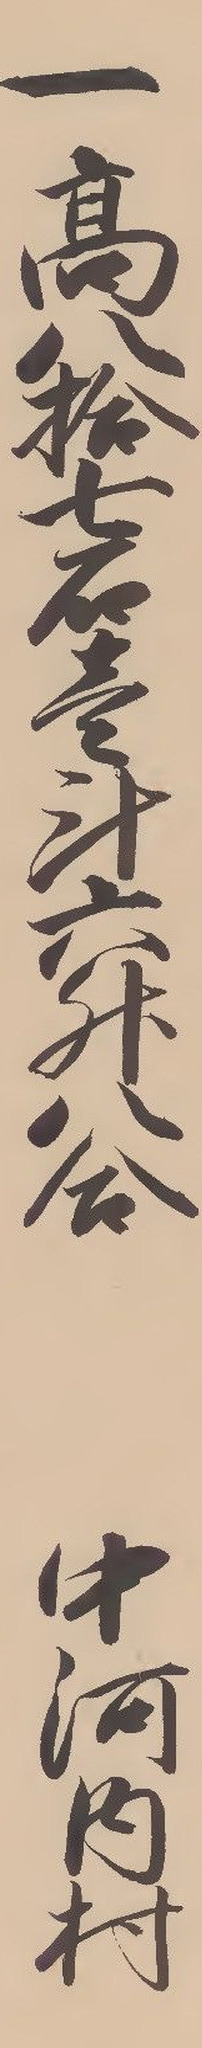一高八拾七石壱斗六升八合中河内村
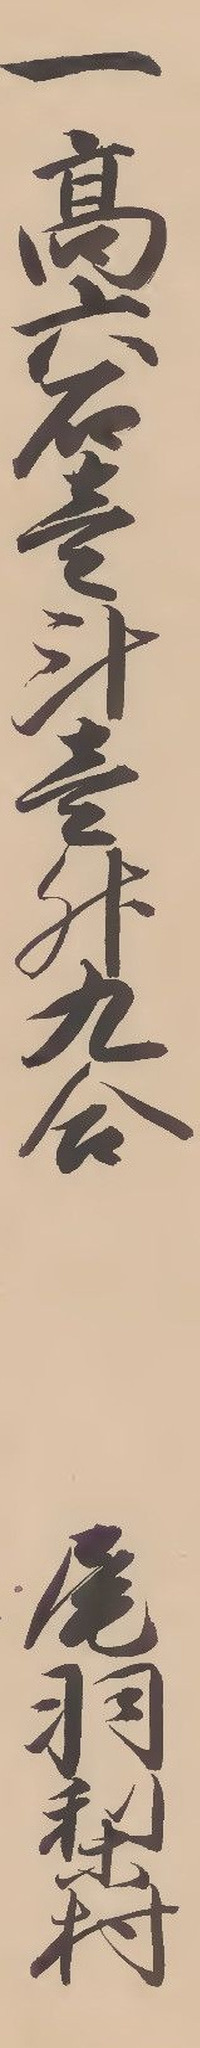一高六石壱斗壱升九合尾羽梨村

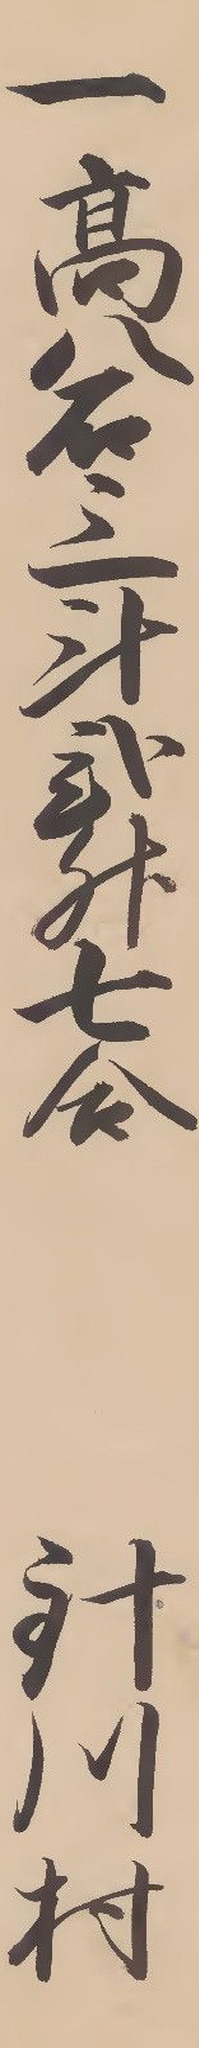一高八石三斗弐升七合針川村
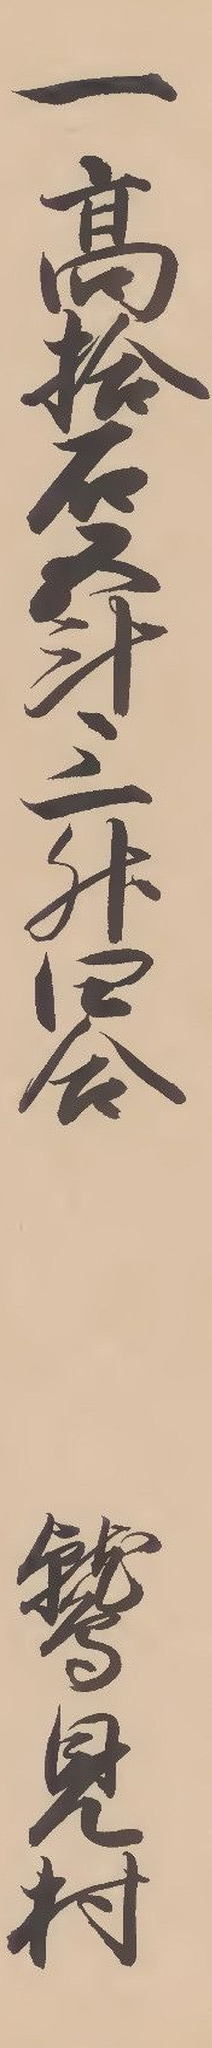一高拾石五斗三升四合鷲見村
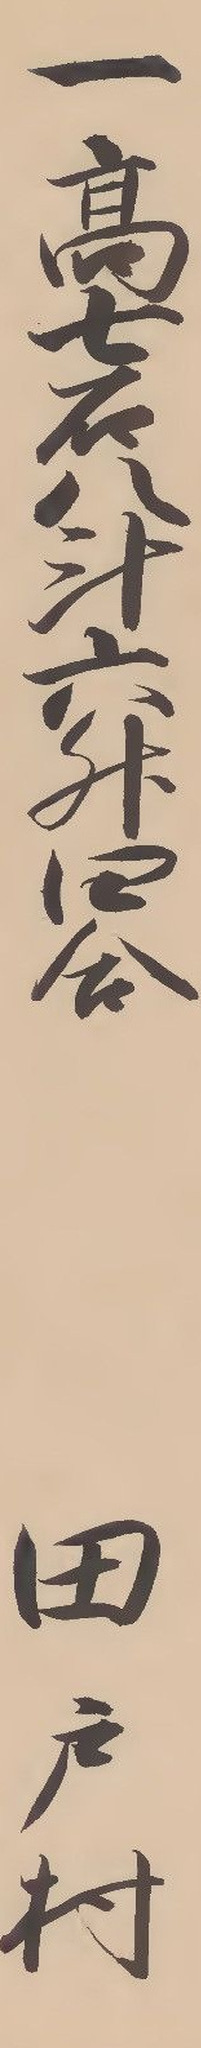一高七石八斗六升四合田戸村
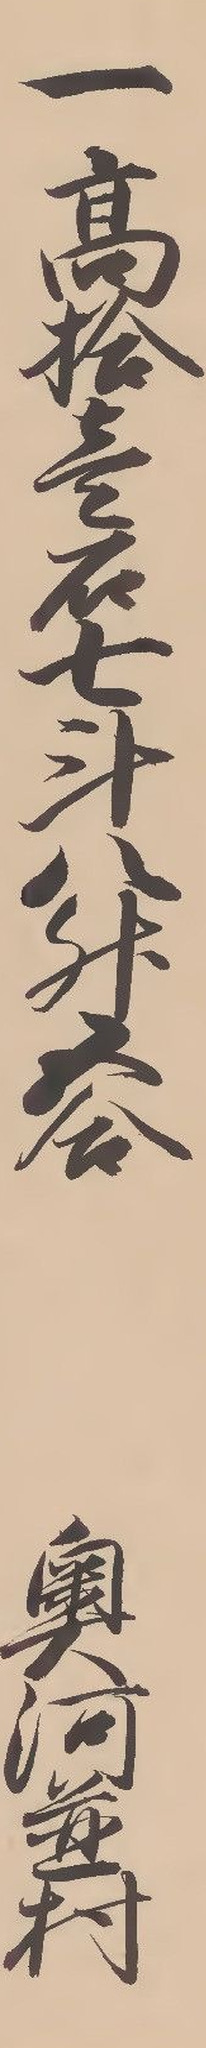一高拾壱石七斗八升五合奥河並村
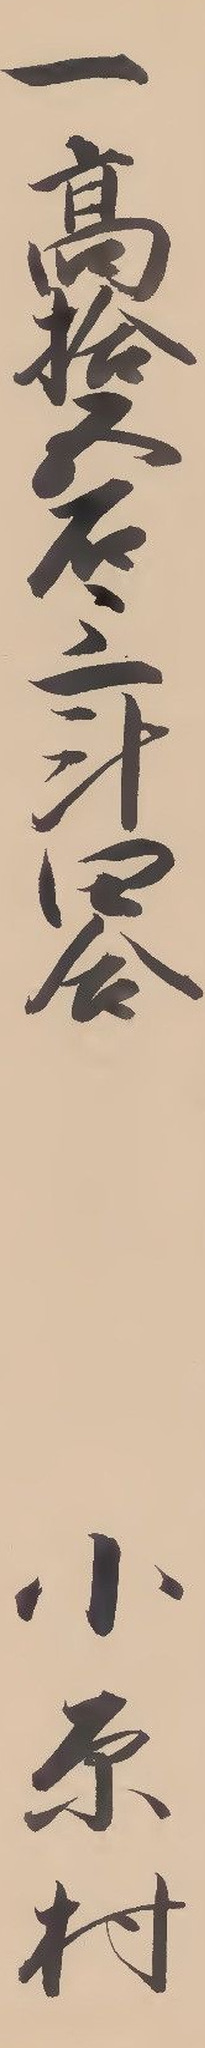一高拾五石三斗四合小原村
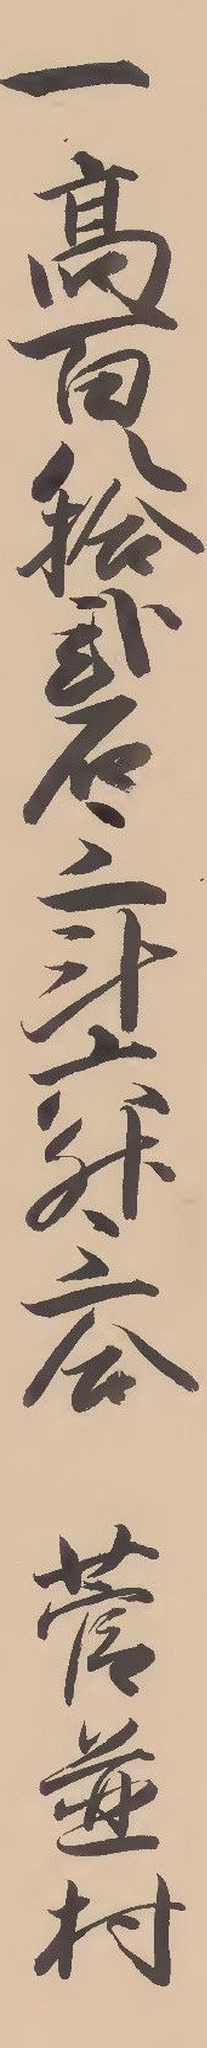一高百八拾弐石三斗六升三合菅並村
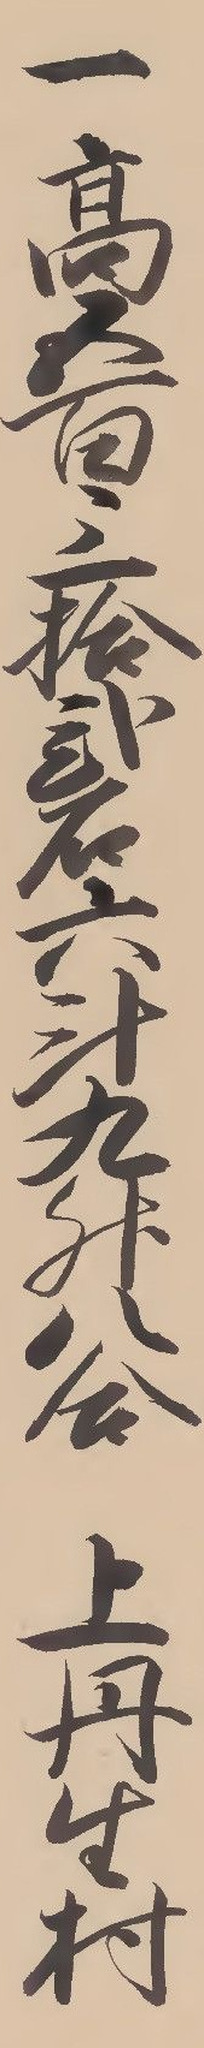一高五百三拾弐石六斗九升八合上丹生村
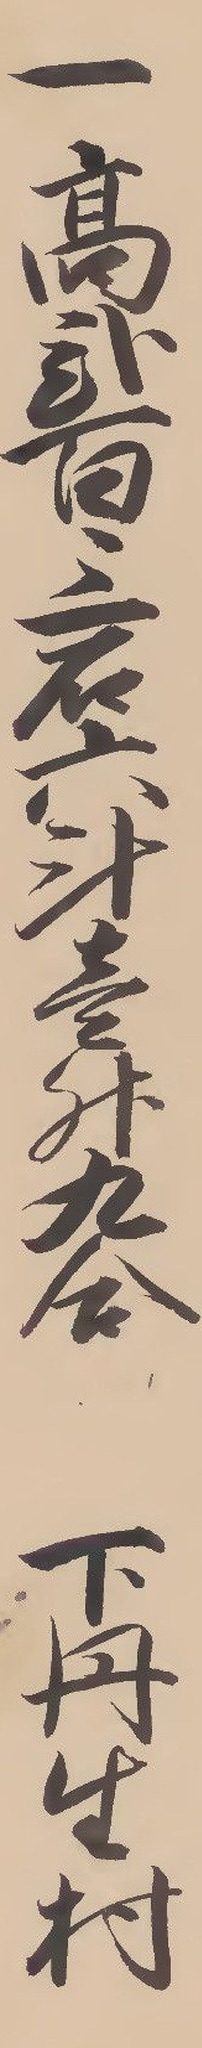一高弐百三石六斗壱升九合下丹生村

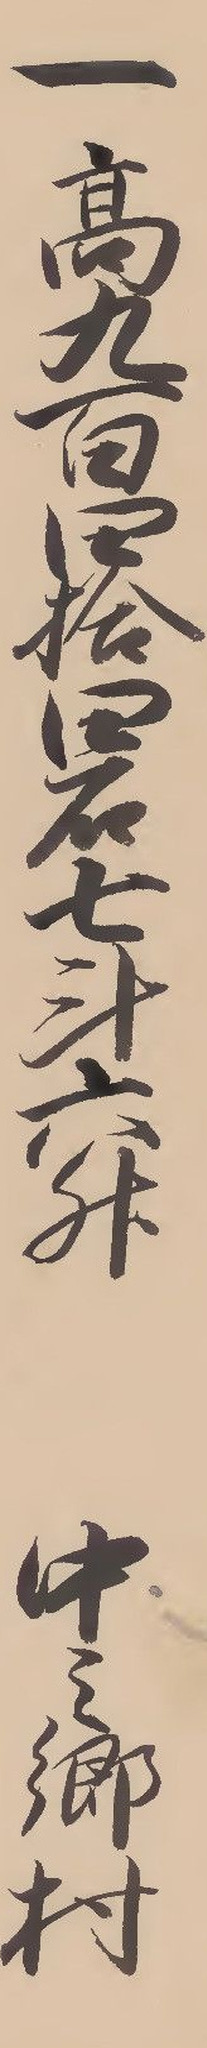一高九百四拾四石七斗六升中之郷村
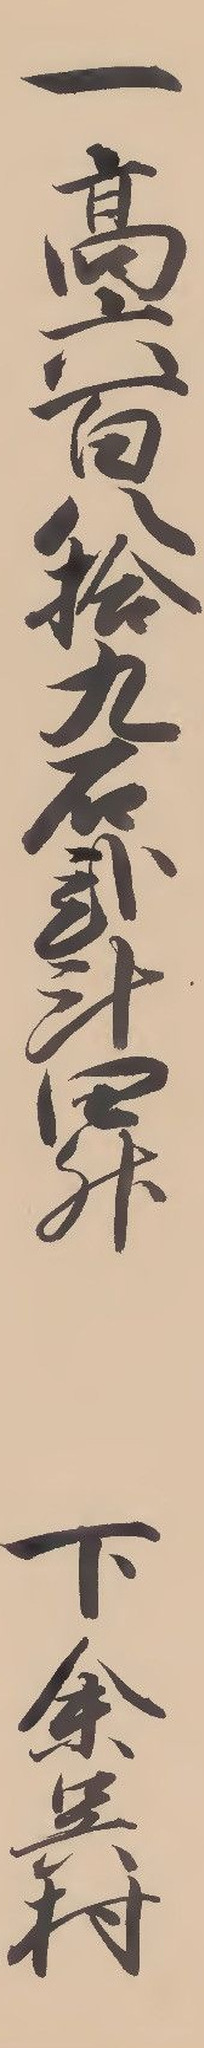一高六百八拾九石弐斗四升下余呉村
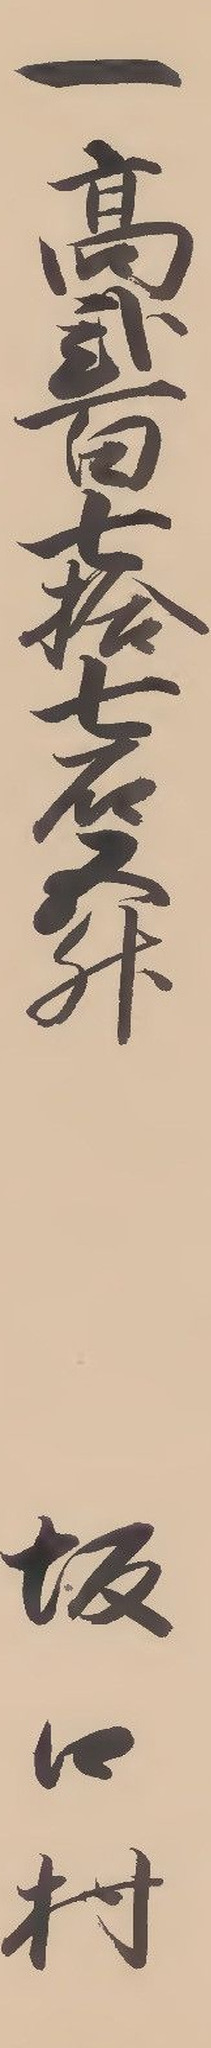一高弐百七拾七石五升坂口村
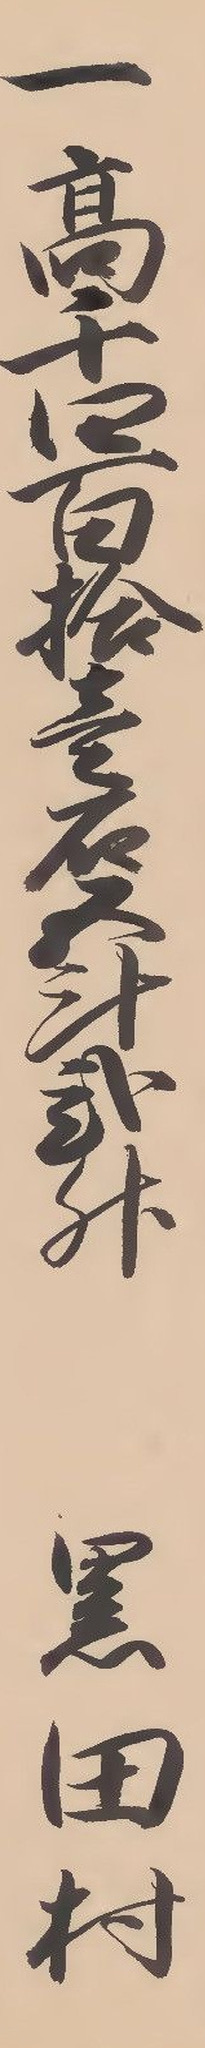一高千四百拾壱石五斗弐升黒田村
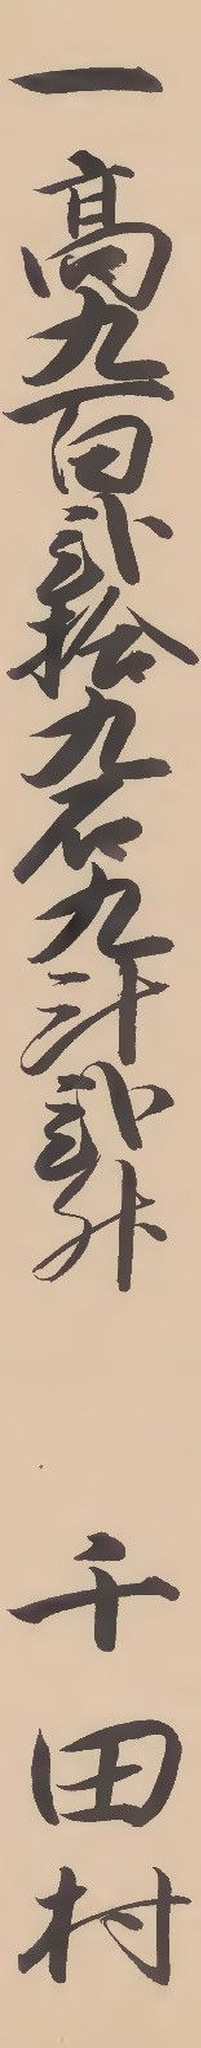一高九百弐拾九石九斗弐升千田村
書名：近江国郷帳
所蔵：国立公文書館 National Archives of Japan
